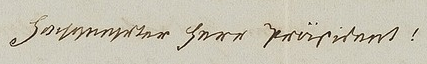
Hochverehrter Herr Präsident!
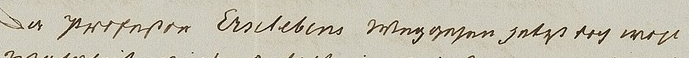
Da Profeßor Erxlebens Weggehen jetzt doch wohl
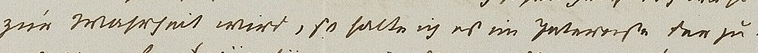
zur Wahrheit wird, so halte ich es im Intereße der ju-
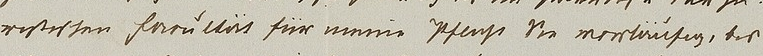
ristischen Facultät für meine Pflicht Sie vorläufig, bis
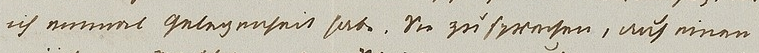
ich einmal Gelegenheit habe, Sie zu sprechen, auf einen
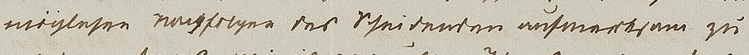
möglichen Nachfolger des Scheidenden aufmerksam zu
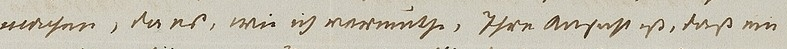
machen, da es, wie ich vermuthe, Ihre Ansicht ist, daß ein
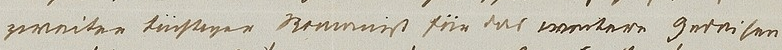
zweiter tüchtiger Romanist für das weitere Gedeihen
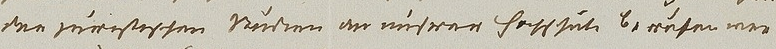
der juristischen Studien an unsrer Hochschule berufen wer-
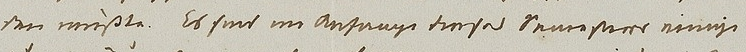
den müßte. Es sind im Anfange dieses Semesters einige
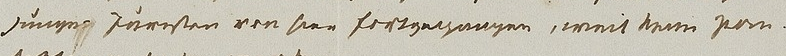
junge Juristen von hier fortgegangen, weil keine Pan-
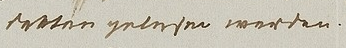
dekten gelesen werden.
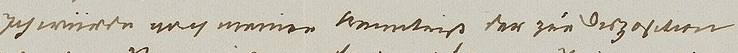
Ich würde nach meiner Kenntniß der zur Disposition
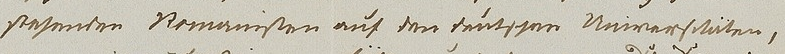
stehenden Romanisten auf den deutschen Universitäten,
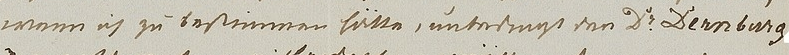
wenn ich zu bestimmen hätte, unbedingt den DrDernburg,
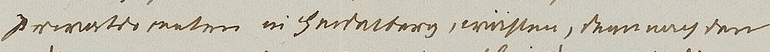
Privatdocenten in Heidelberg, erwählen, denn nach den
